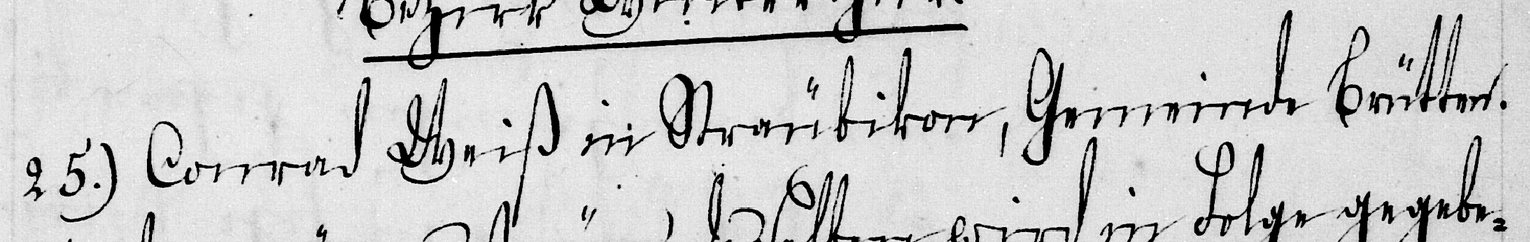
25.) Conrad Weiß in Sträubikon, Gemeinde Brütten.
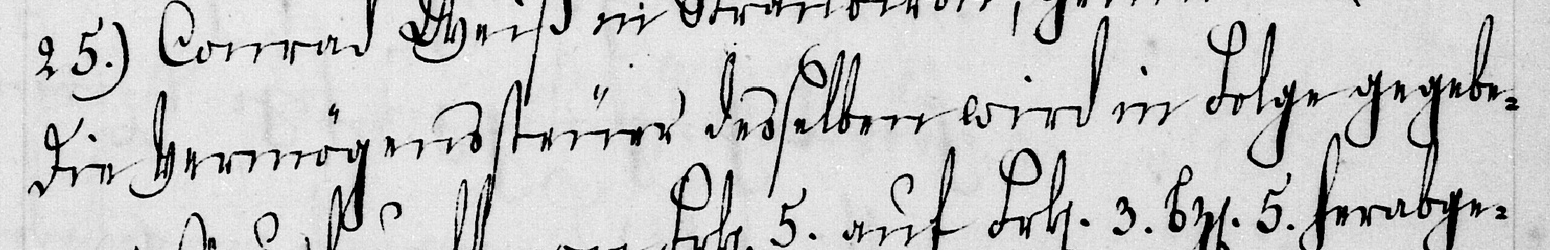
Die Vermögenssteuer desselben wird in Folge gegebe¬
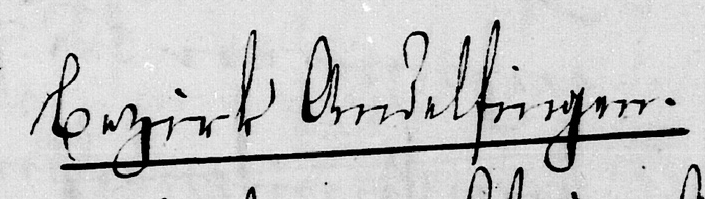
Bezirk Andelfingen.
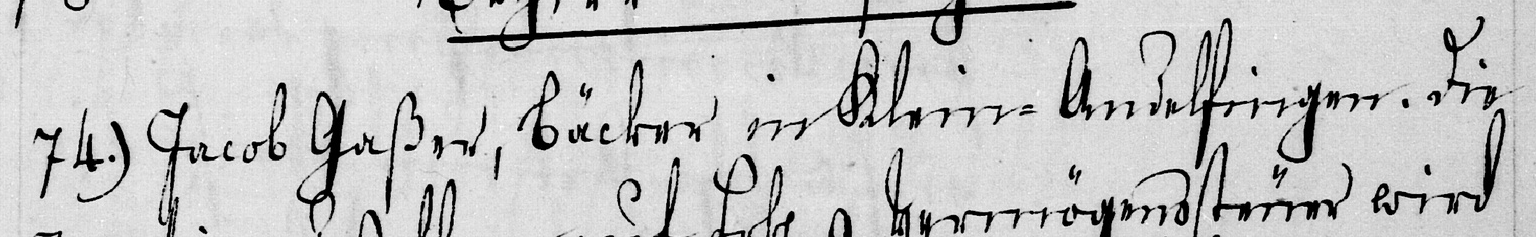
74.) Jacob Gaßer, Bäcker in Klein-Andelfingen. Die
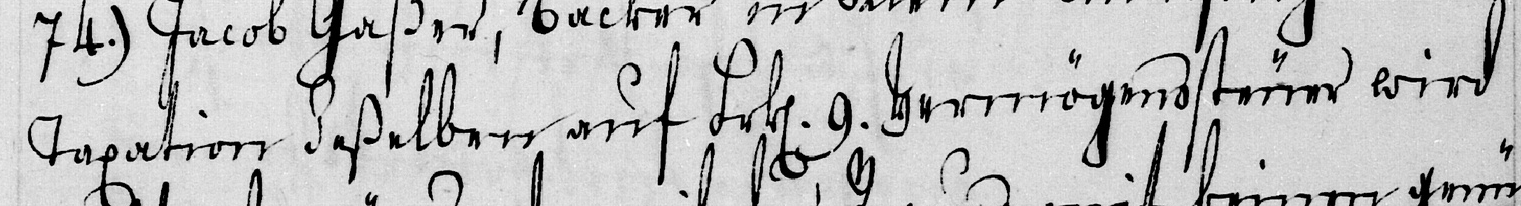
Taxation deßelben auf Frk[en]. 9. Vermögenssteuer wird
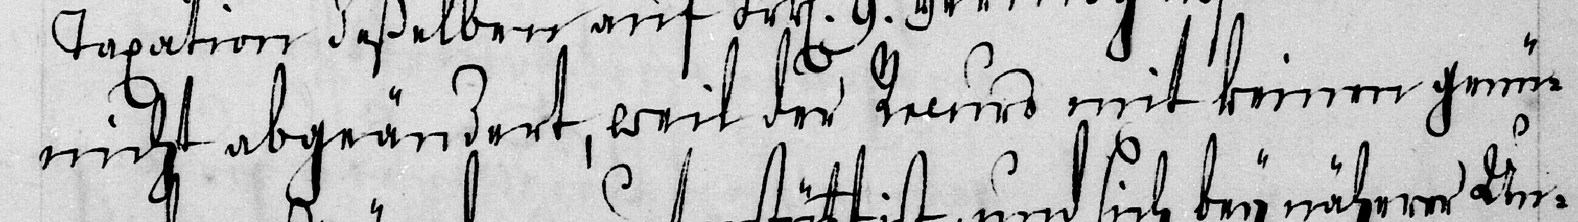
nicht abgeändert, weil der Recurs mit keinen genü¬
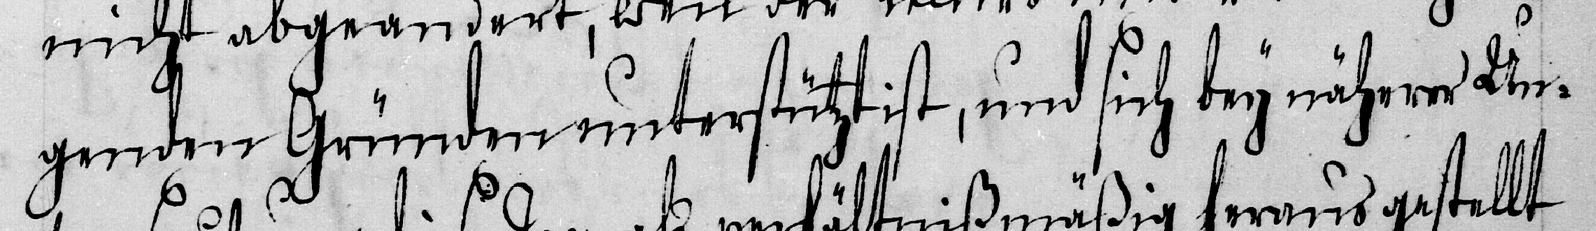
genden Gründen unterstützt ist, und sich bey näherer Un¬
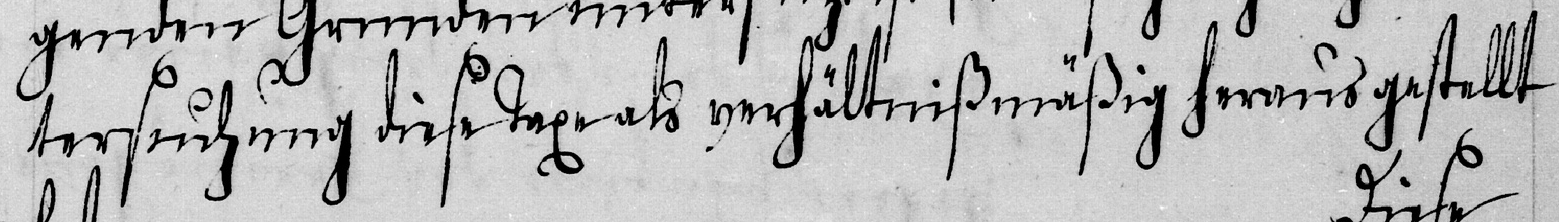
tersuchung diese Taxe als verhältnißmäßig herausgestellt
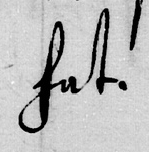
hat.
